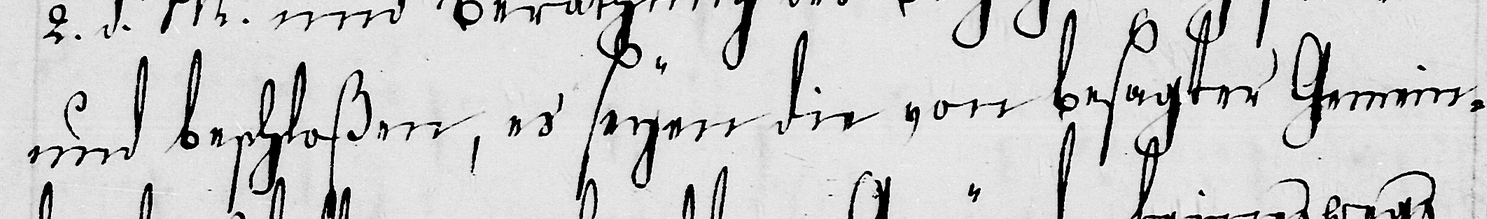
und beschloßen, es seyen die von besagter Gemein¬
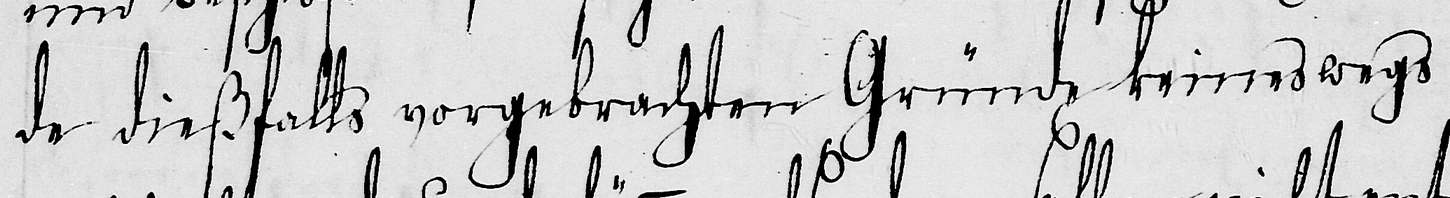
de dießfalls vorgebrachten Gründe keineswegs
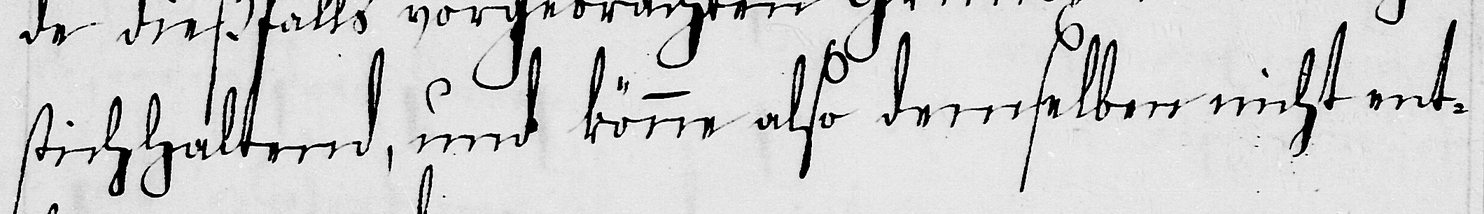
stichhaltend, und könne also demselben nicht ent¬
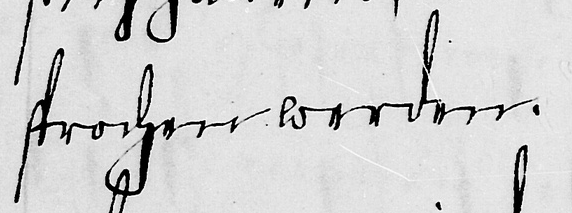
sprochen werden.
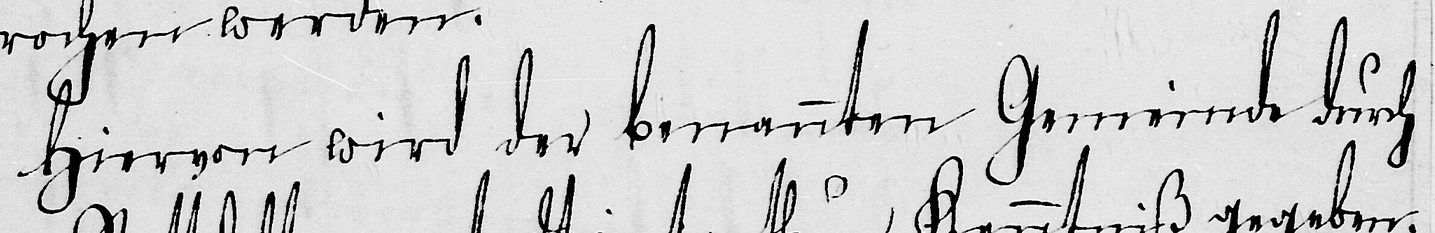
Hiervon wird der benannten Gemeinde durch
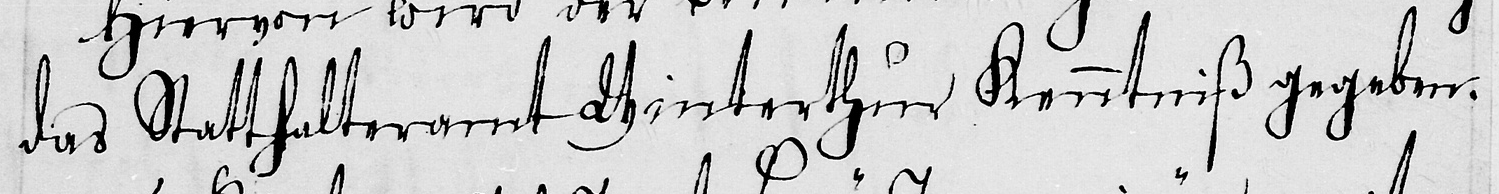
das Statthalteramt Winterthur Kenntniß gegeben.
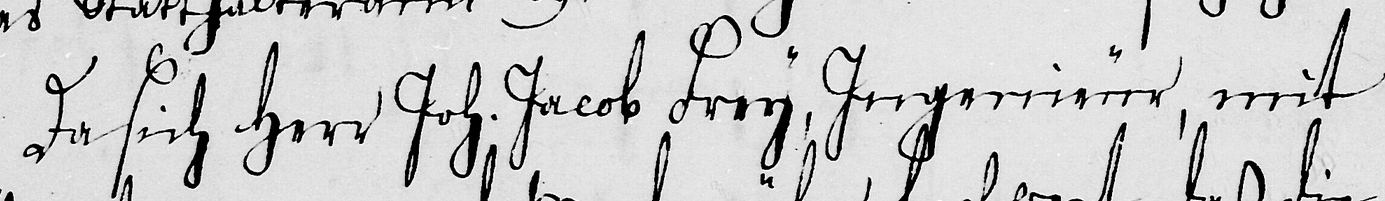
Da sich Herr Joh. Jacob Frey, Ingenieur, mit
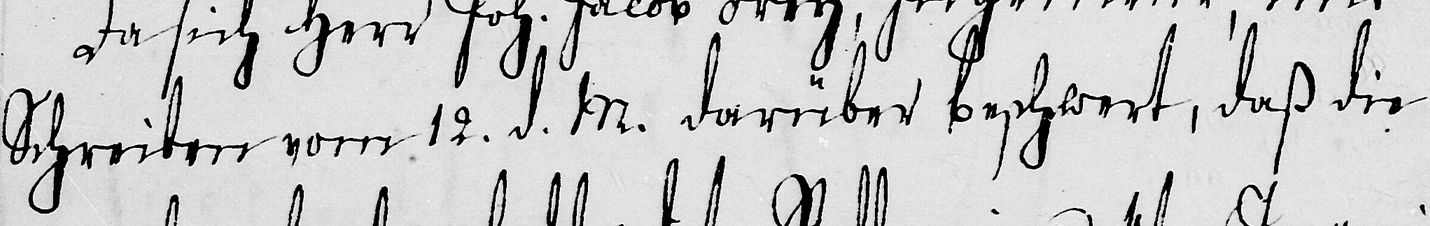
Schreiben vom 12. d. M. darüber beschwert, daß die
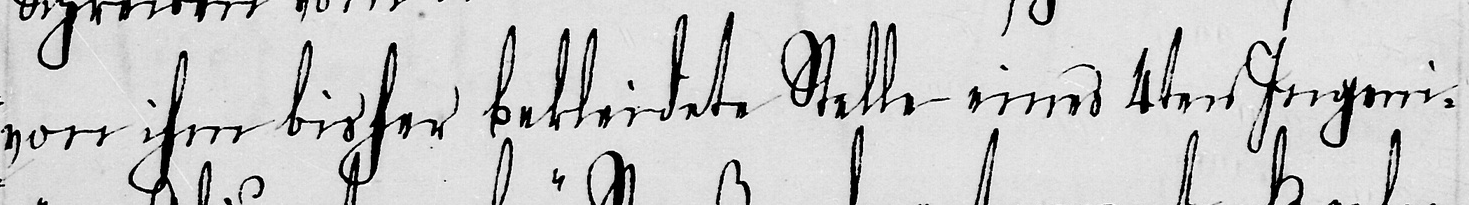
von ihm bisher bekleidete Stelle eines 4ten Ingen¬
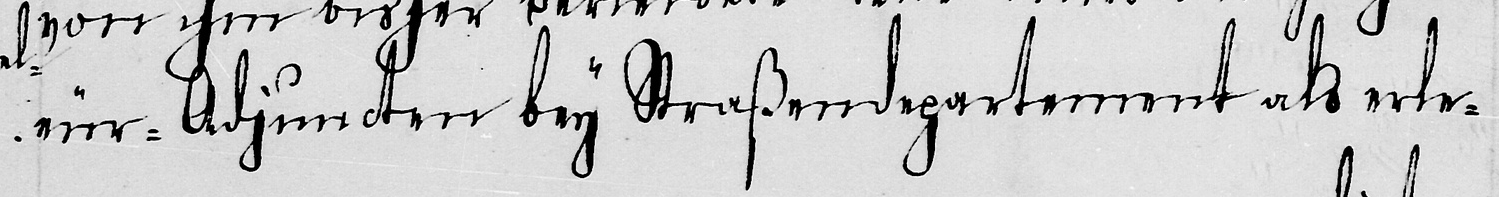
ieur-Adjuncten bey[m] Straßendepartement als erle-
